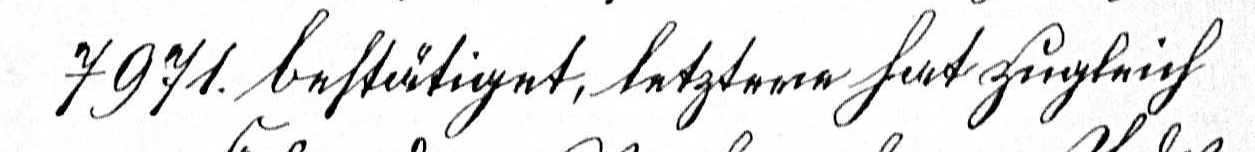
7971 bestätigt, letztere hat zugleich
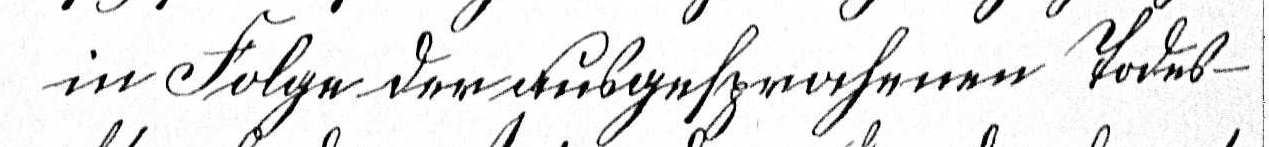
in Folge der ausgesprochenen Todes¬
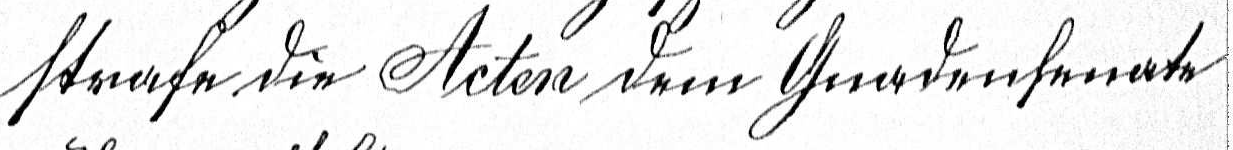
strafe die Acten dem Gnadensenate
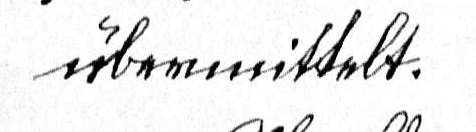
übermittelt.
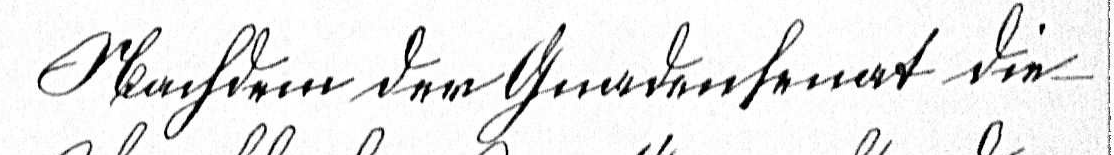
Nachdem der Gnadensenat die¬
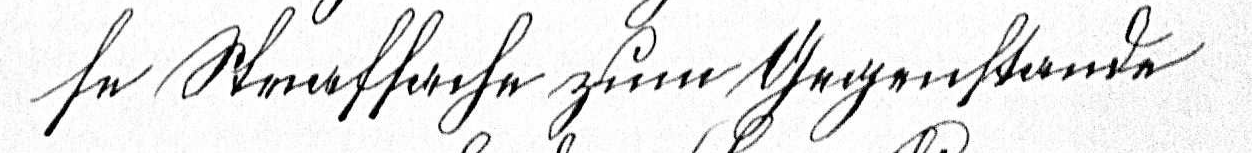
se Strafsache zum Gegenstande
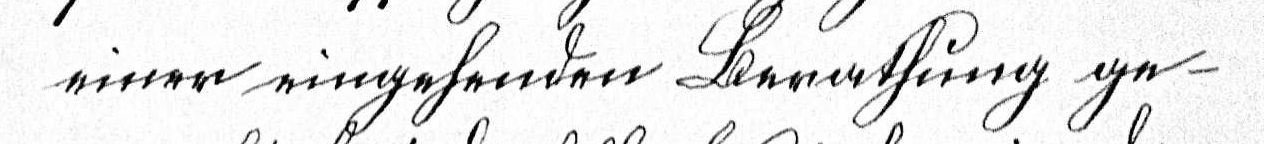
einer eingehenden Berathung ge¬
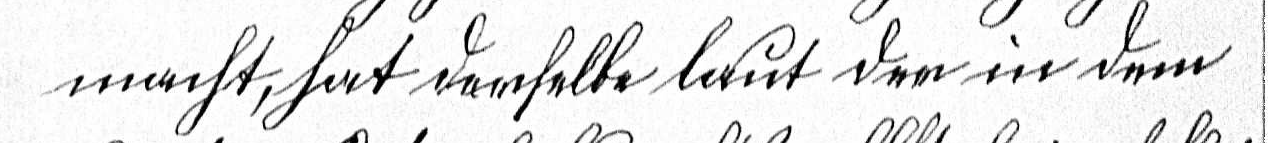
macht, hat derselbe laut der in dem
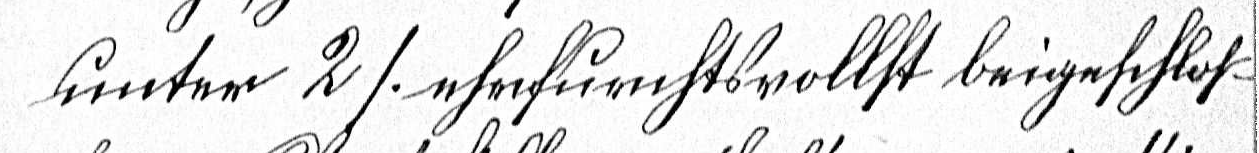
unter 2) ehrfurchtsvollst beigeschlos¬
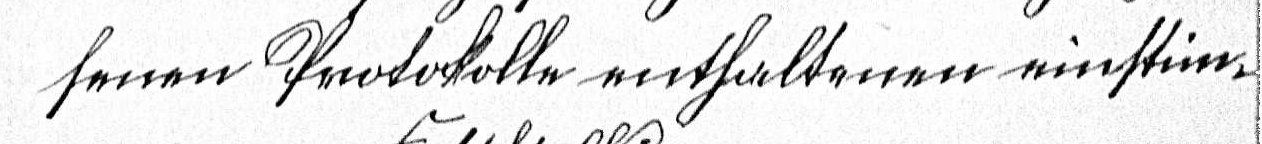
senen Protokolle enthaltenen einstim¬
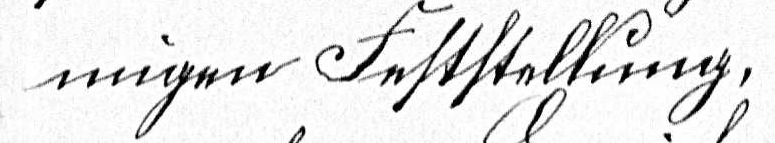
migen Feststellung.
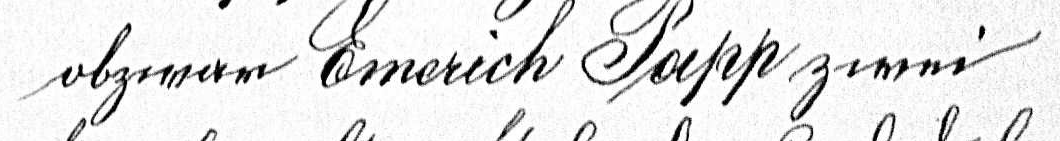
Obzwar Emerich Papp zwei
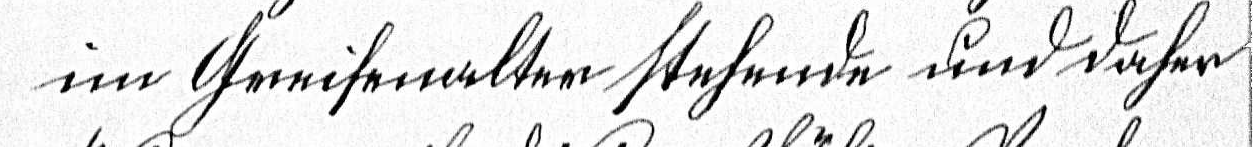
im Greisenalter stehende und daher
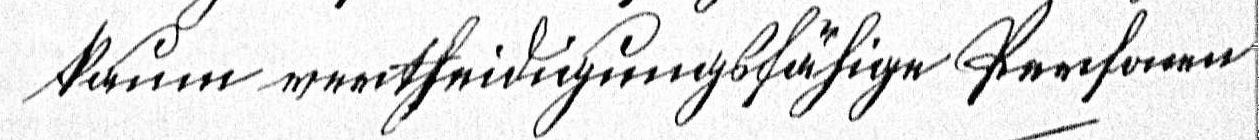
kaum vertheidigungsfähige Personen
